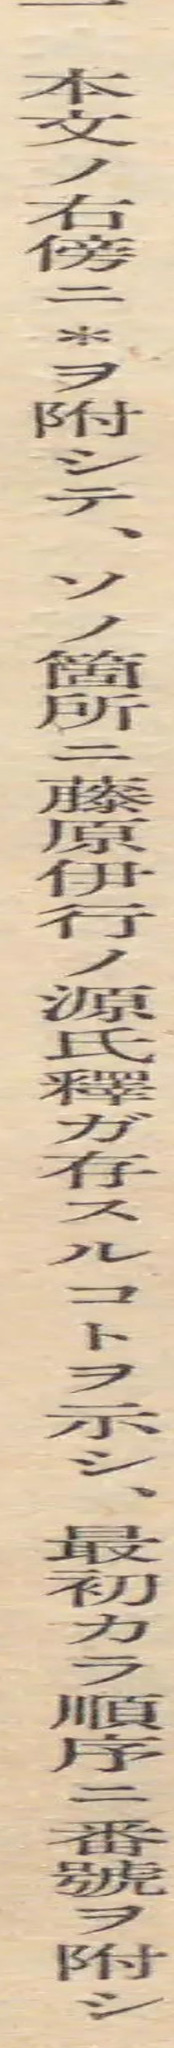一本文ノ右傍ニ＊ヲ附シテ、ソノ箇所ニ藤原伊行ノ源氏釈ガ存スルコトヲ示シ、最初カラ順序ニ番号ヲ附シ
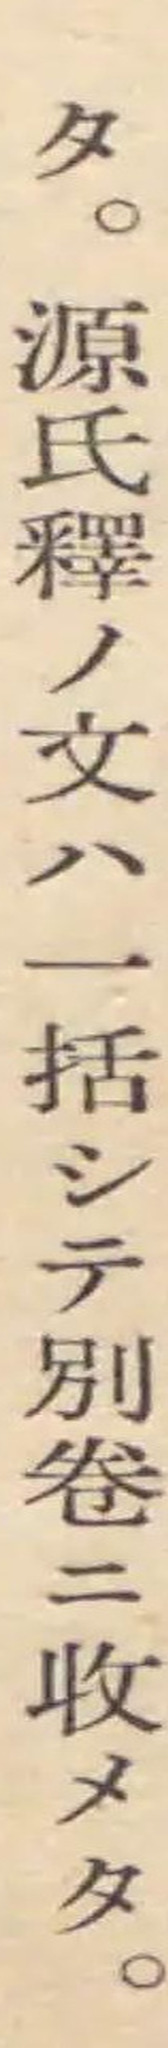タ。源氏釈ノ文ハ一括シテ別巻ニ収メタ。
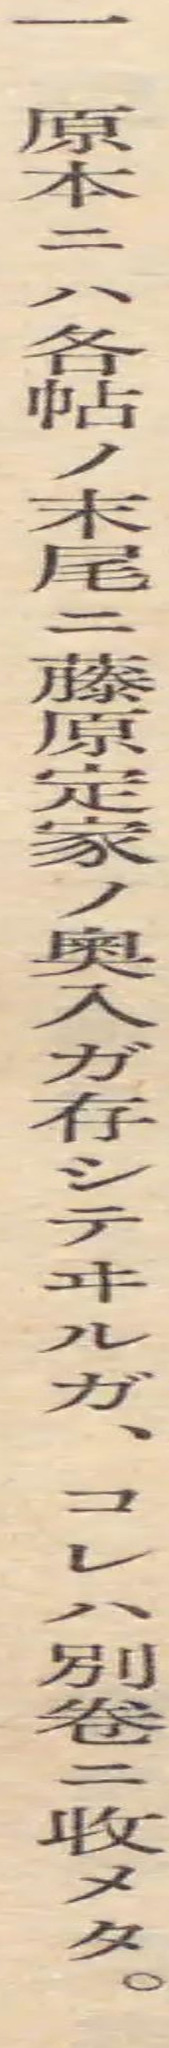一原本ニハ各帖ノ末尾ニ藤原定家ノ奥入ガ存シテヰルガ、コレハ別巻ニ収メタ。
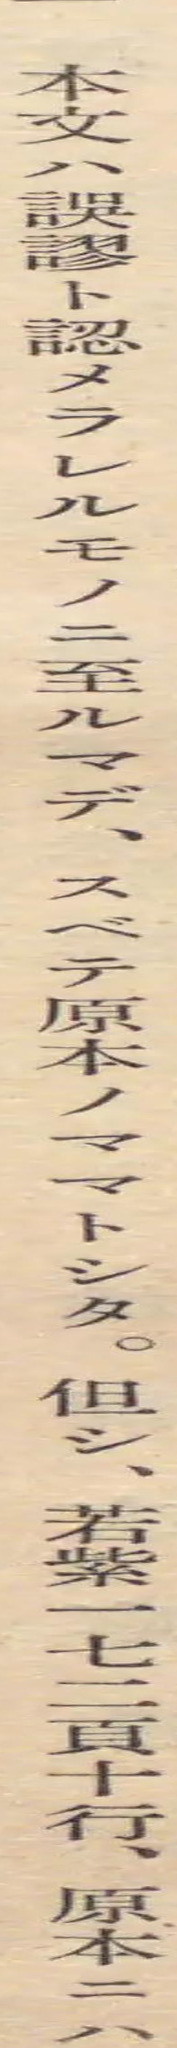一本文ハ誤謬ト認メラレルモノニ至ルマデ、スベテ原本ノママトシタ。但シ、若紫一七二頁十行、原本ニハ
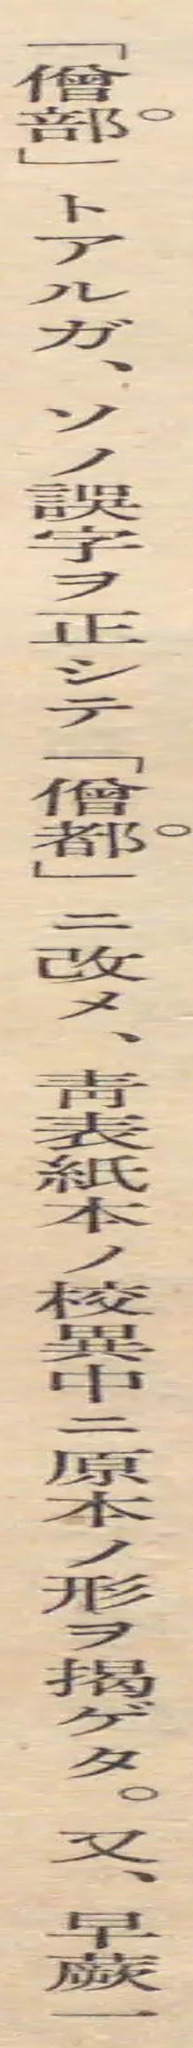「僧部」トアルガ、ソノ誤字ヲ正シテ「僧都」に改メ、青表紙本ノ校異中ニ原本ノ形ヲ掲ゲタ。又、早蕨一
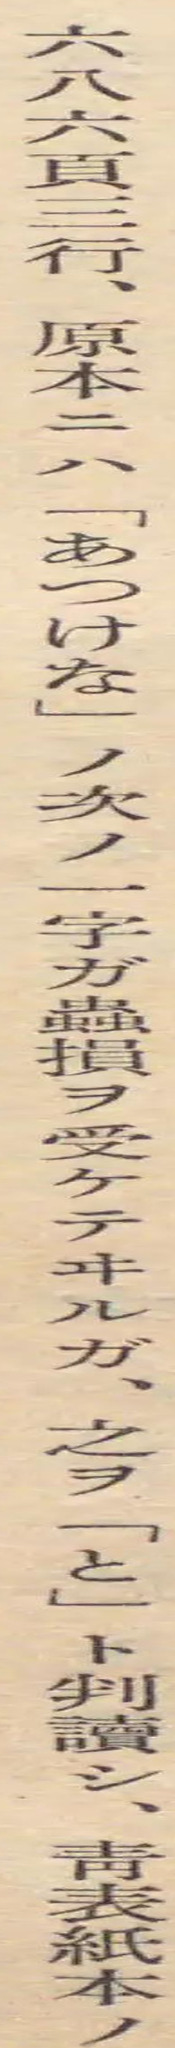六八六頁三行、原本ニハ「あつけな」ノ次ノ一字ガ虫損ヲ受ケテヰルガ、之ヲ「と」ト判読シ、青表紙本ノ
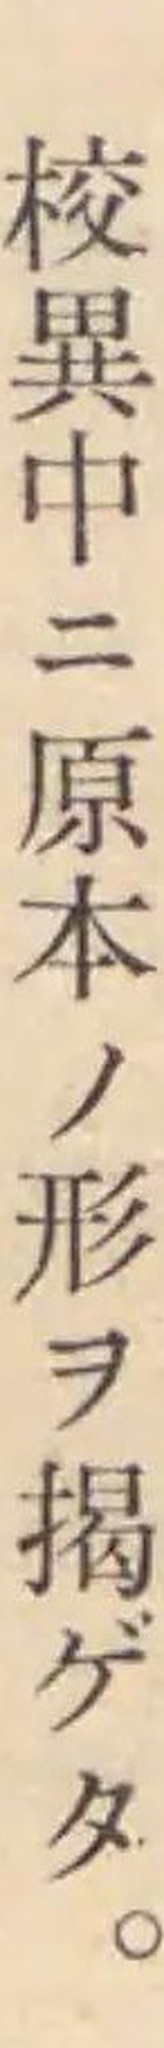校異中ニ原本ノ形ヲ掲ゲタ。
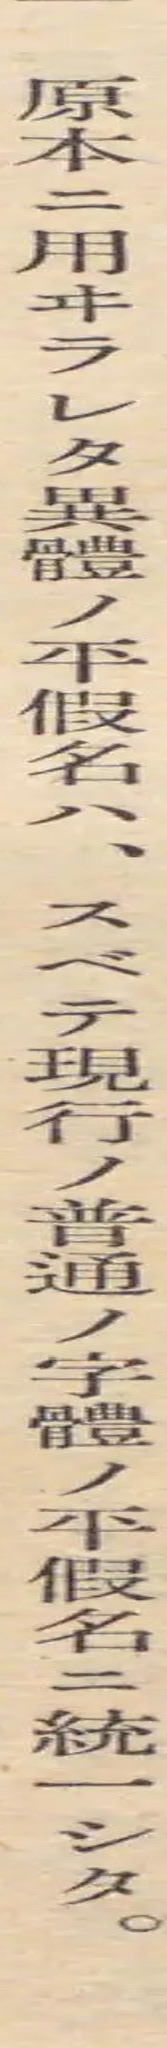一原本ニ用ヰラレタ異体ノ平仮名ハ、スベテ現行ノ普通ノ字体ノ平仮名ニ統一シタ。
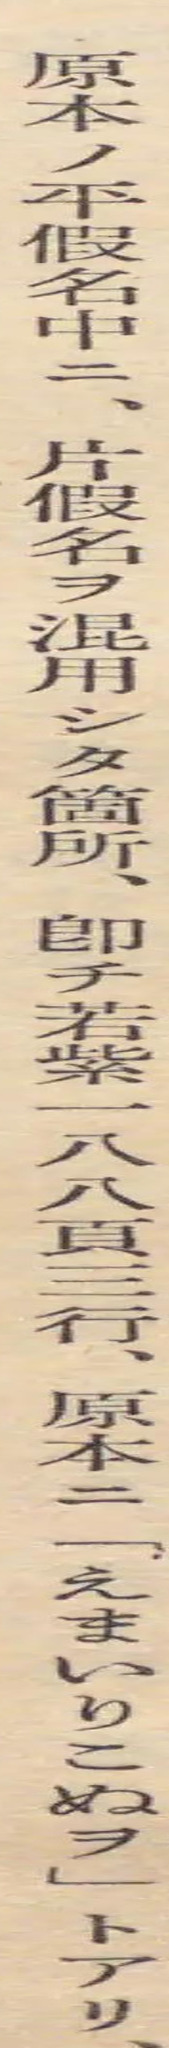一原本ノ平仮名中ニ、片仮名ヲ混用シタ箇所、即チ若紫一八八頁三行、原本ニ「えまいりこぬヲ」トアリ、
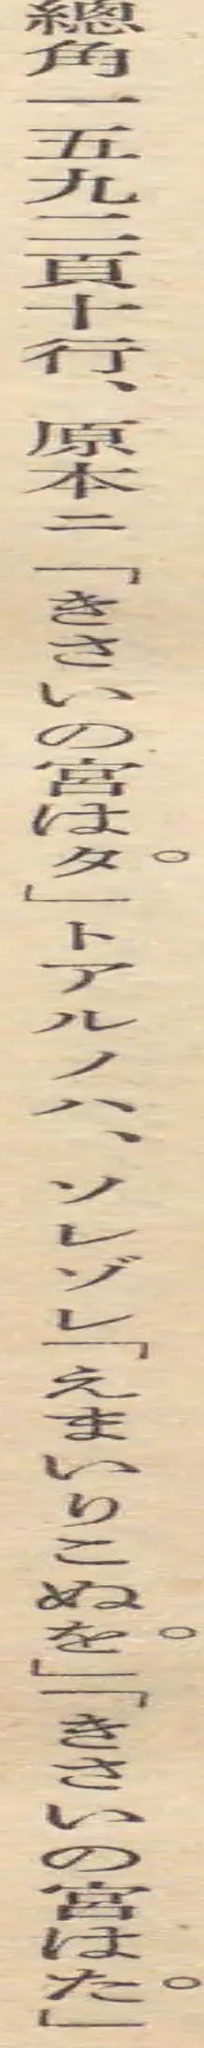総角一五九二頁十行、原本ニ「きさいの宮はタ」トアルノハ、ソレゾレ「えまいりこぬを」「きさいの宮はた」
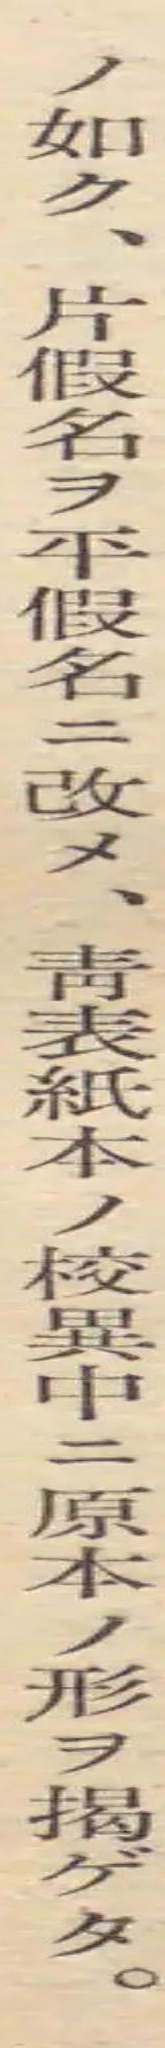ノ如ク、片仮名ヲ平仮名ニ改メ、青表紙本ノ校異中ニ原本ノ形ヲ掲ゲタ。
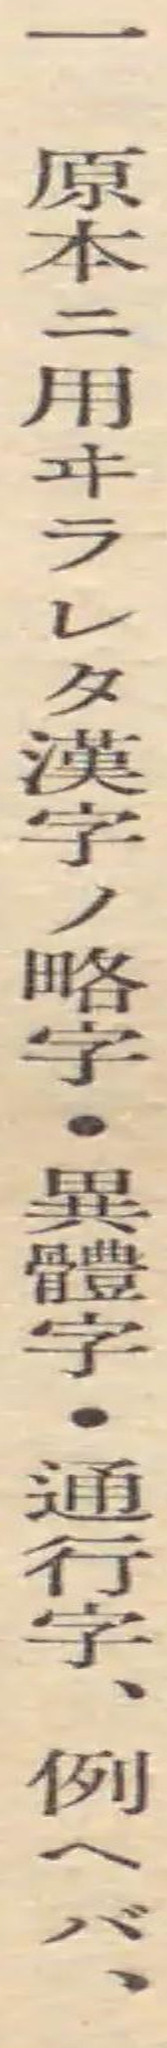一原本ニ用ヰラレタ漢字ノ略字・異体字・通用字、例ヘバ、
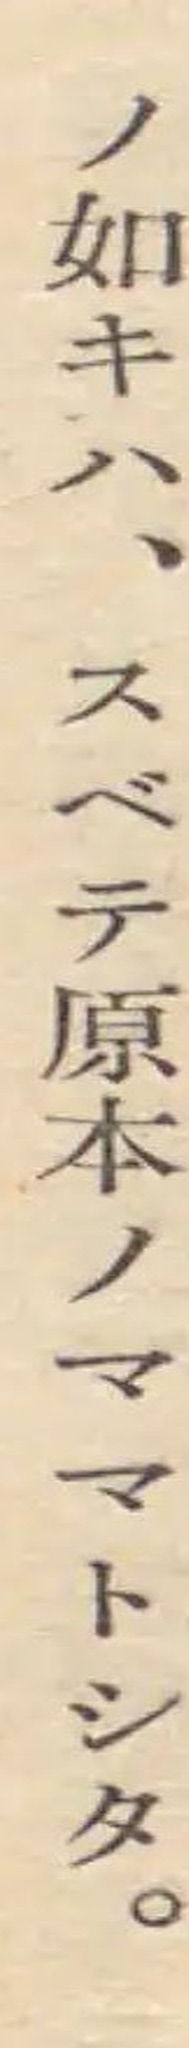ノ如キハ、スベテ原本ノママトシタ。
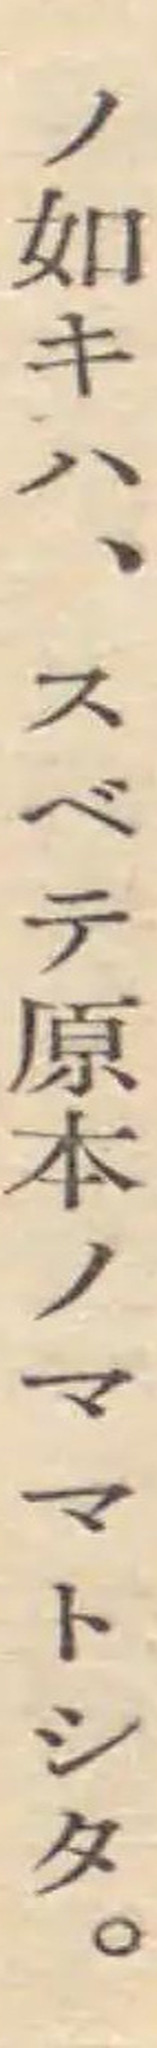ノ如キハ、スベテ原本ノママトシタ。
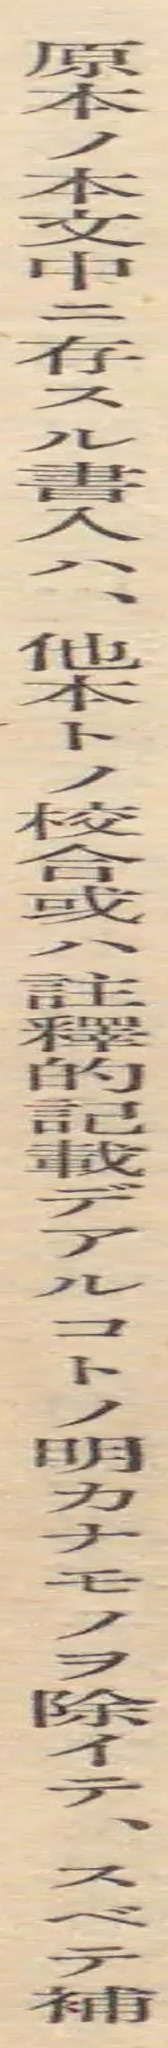一原本ノ本文中ニ存スル書入ハ、他本トノ校合或ハ註釈的記載デアルコトノ明カナモノヲ除イテ、スベテ補
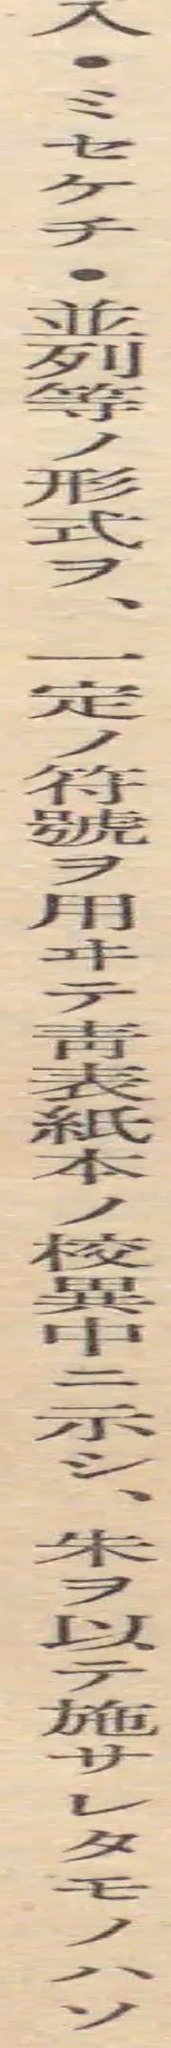入・ミセケチ・並列等ノ形式ヲ、一定ノ符号ヲ用ヰテ青表紙本ノ校異中ニ示シ、朱ヲ以テ施サレタモノハソ
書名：校異源氏物語.
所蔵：国立国会図書館 National Diet Library, JAPAN
